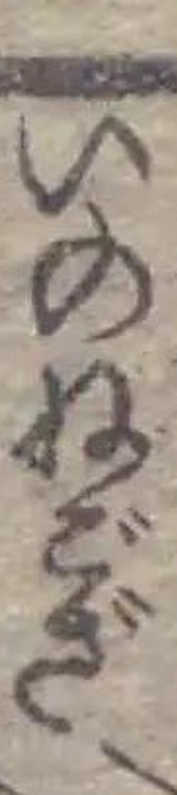いのねござ
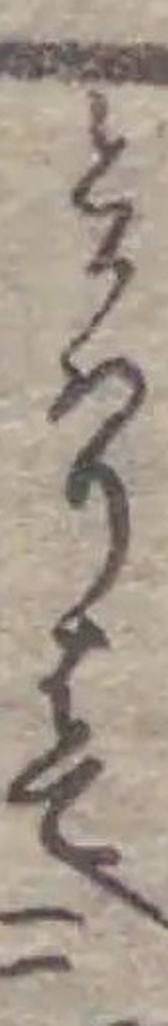とかわりはて
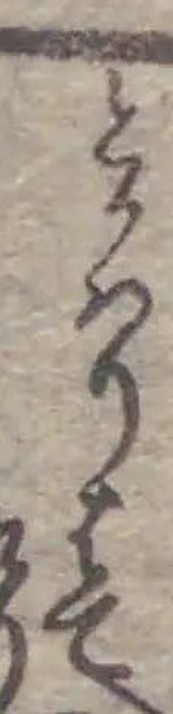とかわりはて
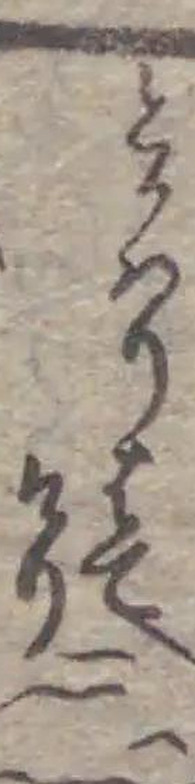とかわりはて
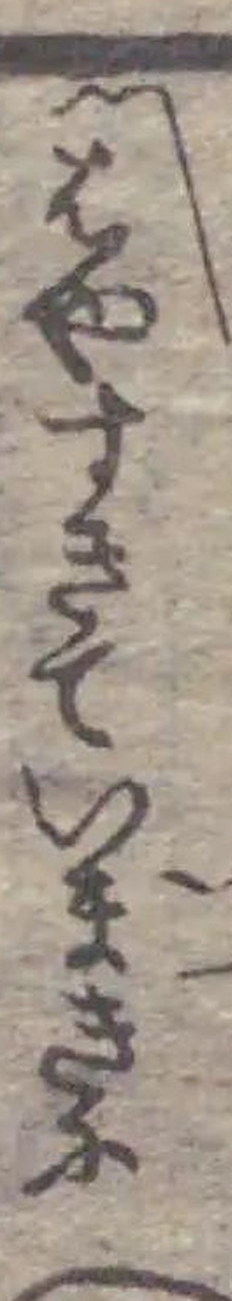〽はやすきていまきに
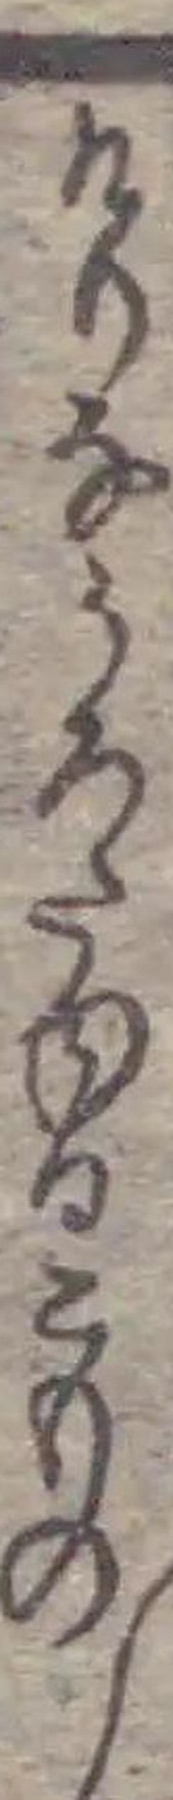けりなうろたゆるこもの
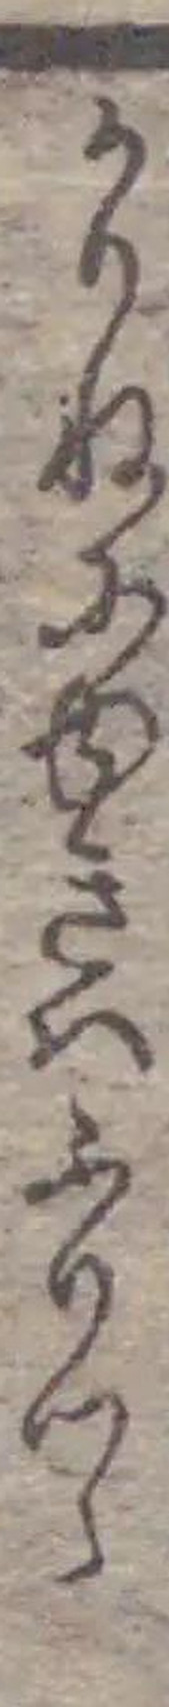かりねにゆきはふりつる
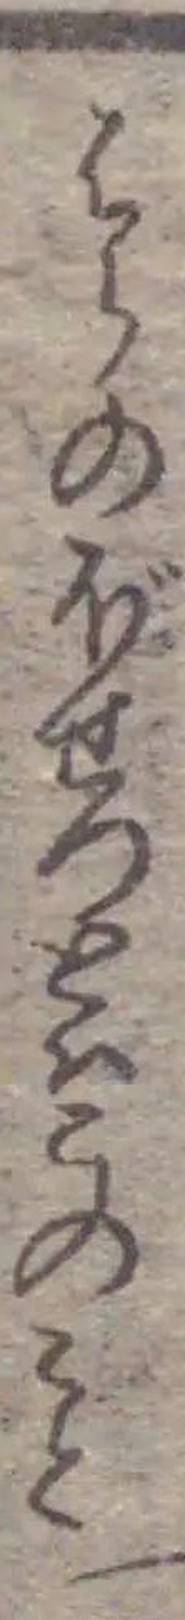はらのぼせつとはこのこと
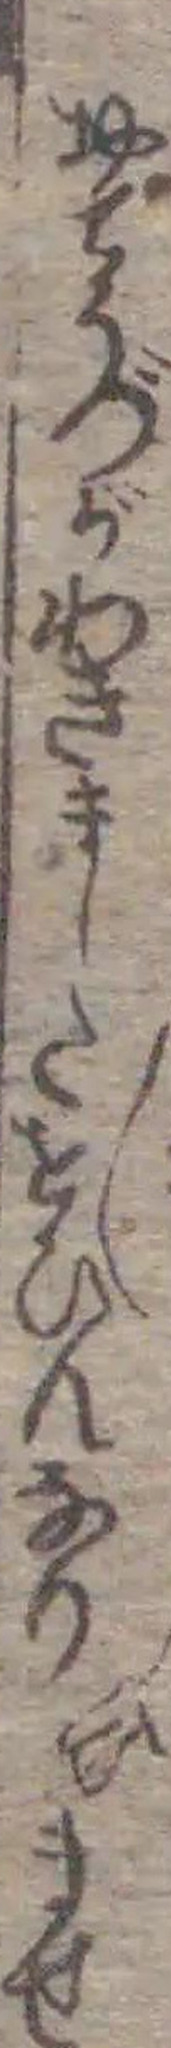おでうづがわきましたをひんなりませ

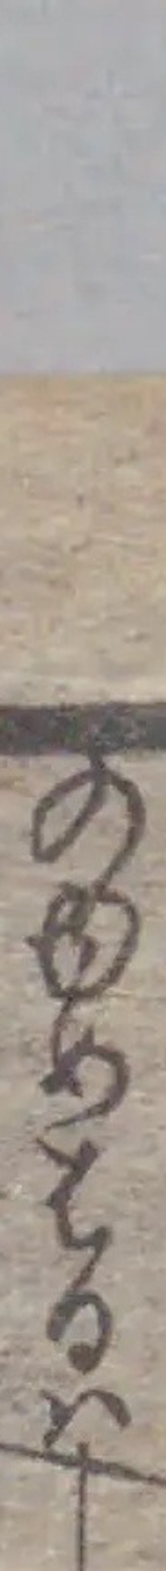のゆめはるは
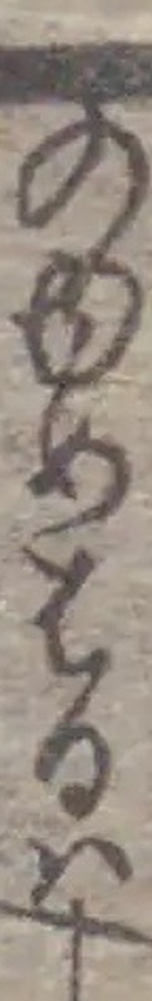のゆめはるは
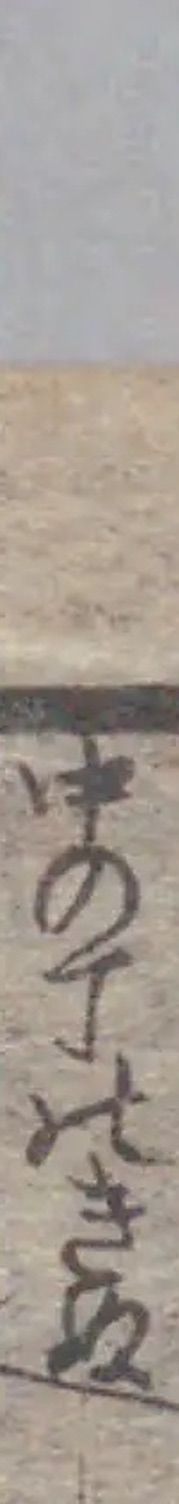中の丁のきぬ
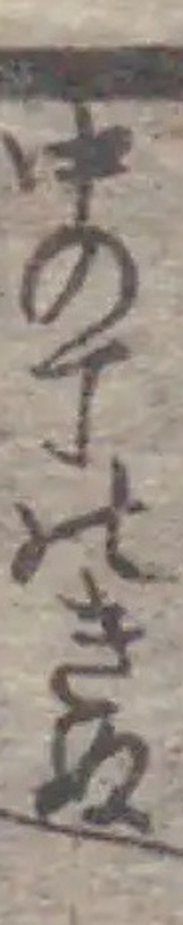中の丁のきぬ
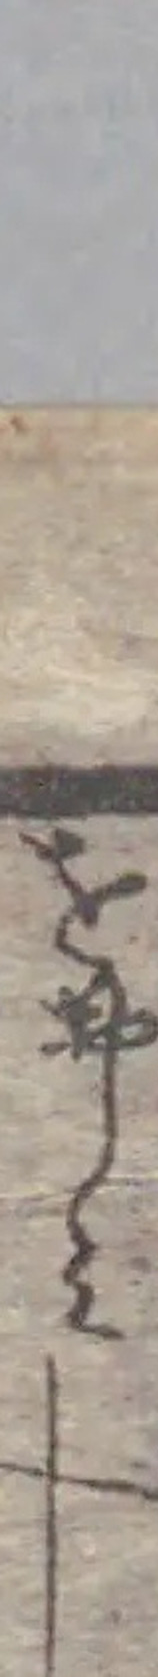をおしみ
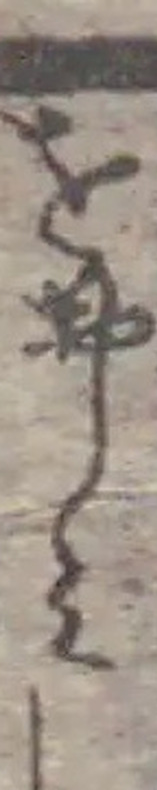をおしみ
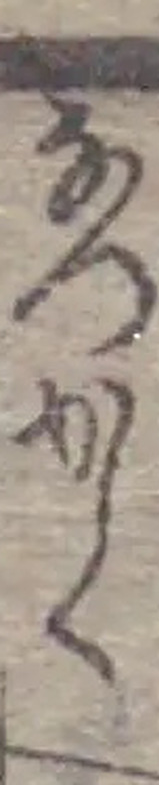なつかしく
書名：かんなんの夢枕 2巻
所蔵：国立国会図書館 National Diet Library, JAPAN
